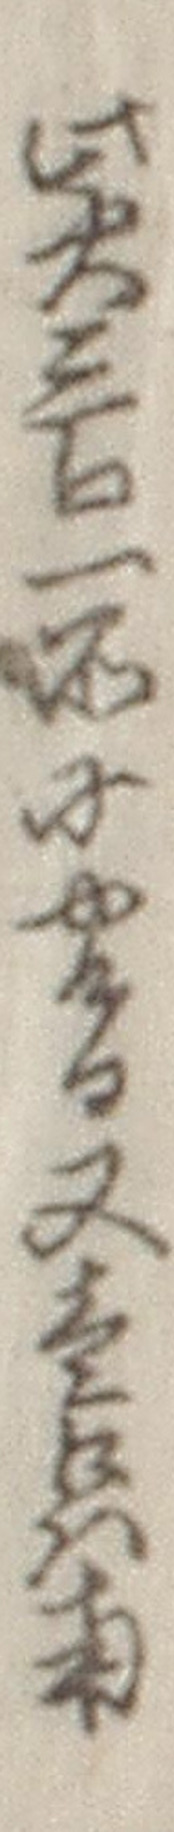此火二百一所にやける又壱百ハ南
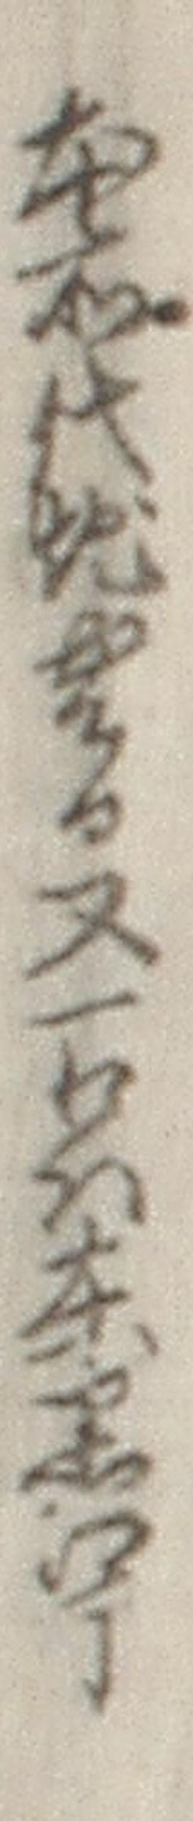本所代地やける又一百ハ東黒江丁
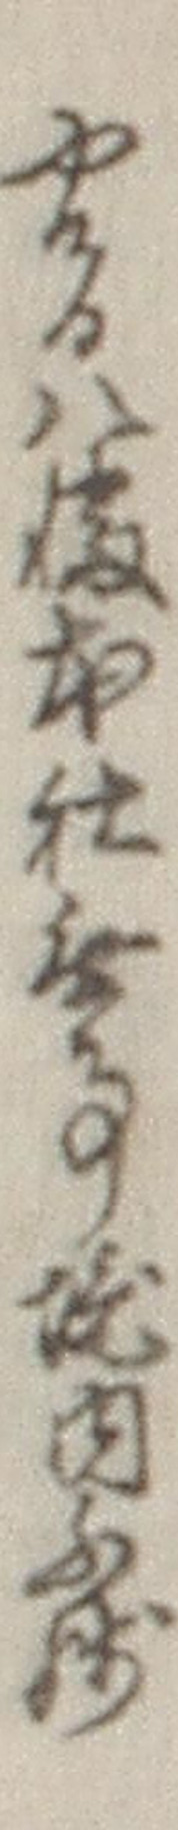やける八幡本社無事境内不残
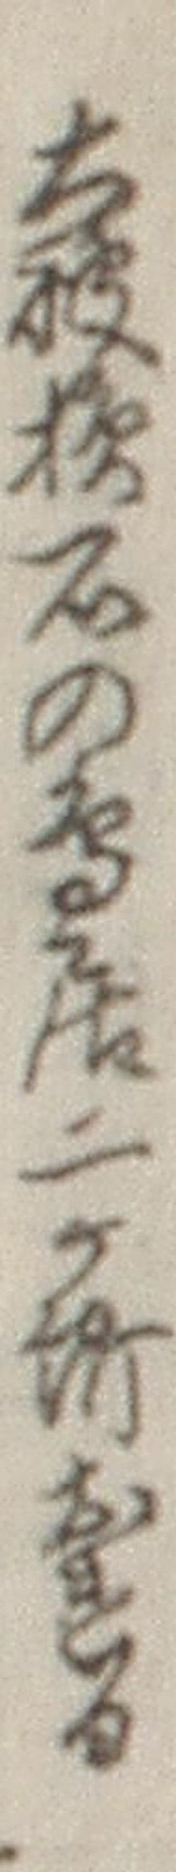大破損石の鳥居二ヶ所おれる
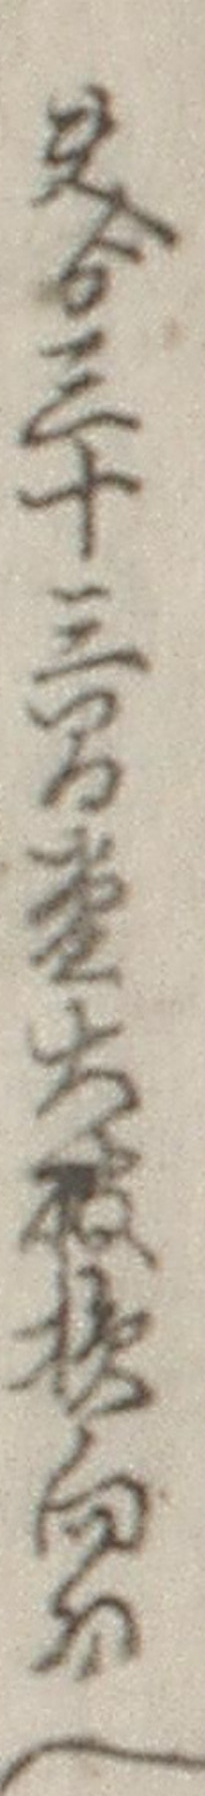夫ゟ三十三間堂大破損向ハ
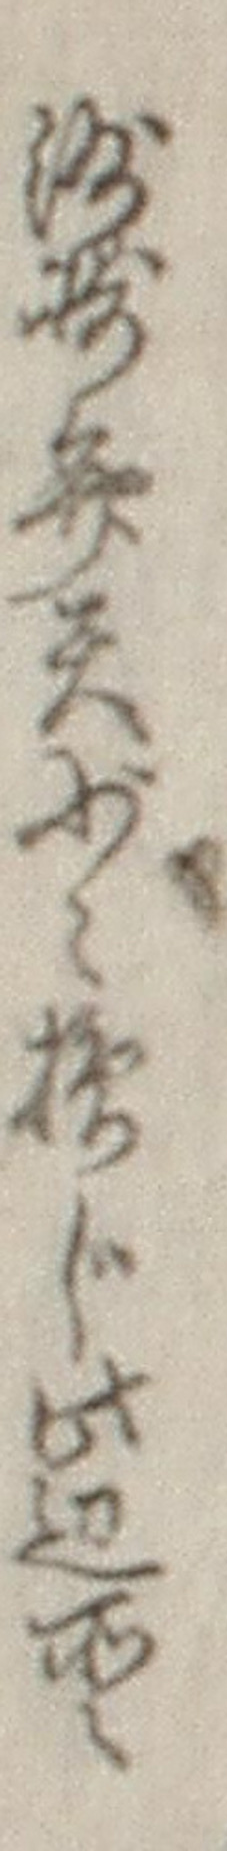洲崎弁天少々損じ此辺所〻
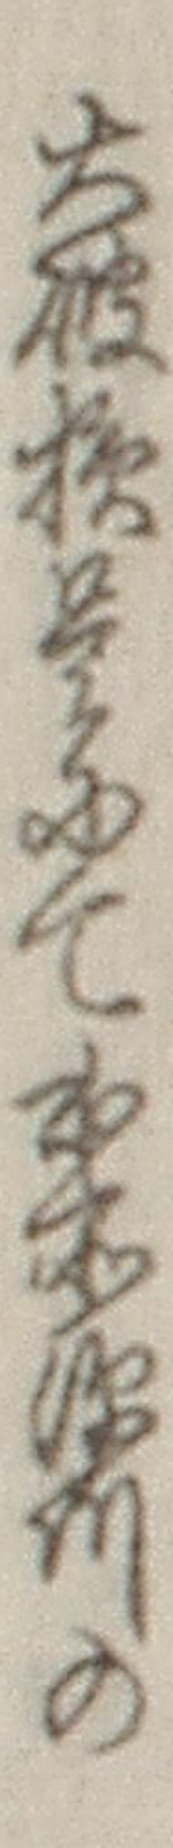大破損にて本所深川の
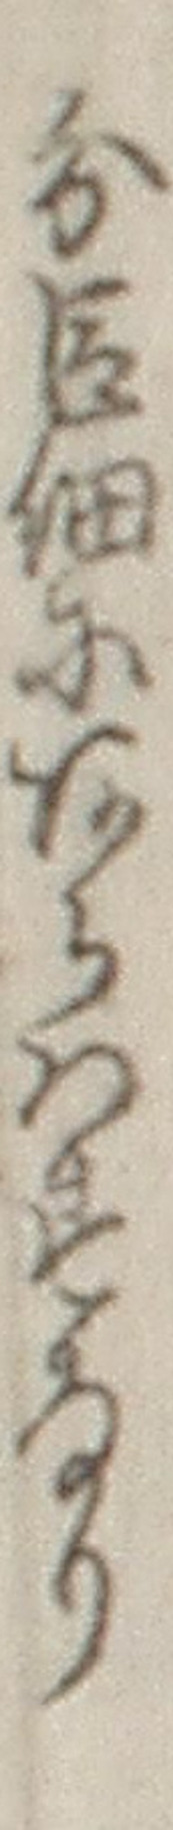分臣細にあらハすなり
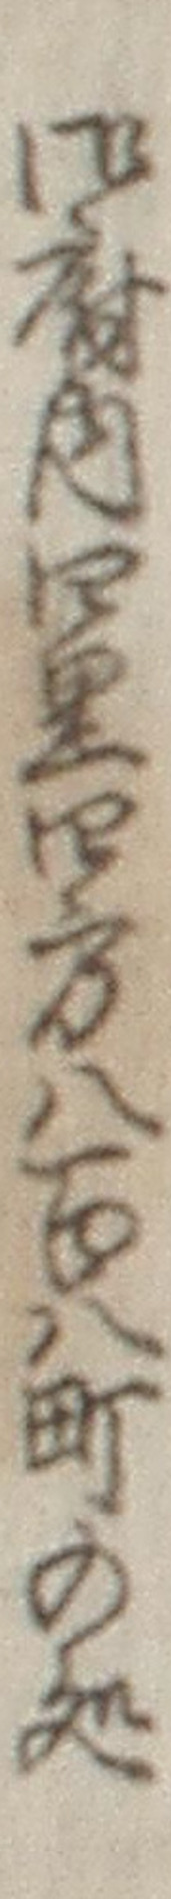御府内四里四方八百八町の処
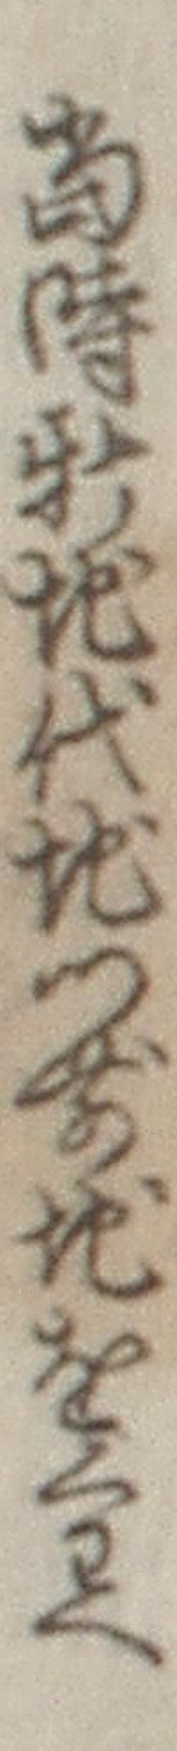当時新地代地門前地をくわへ
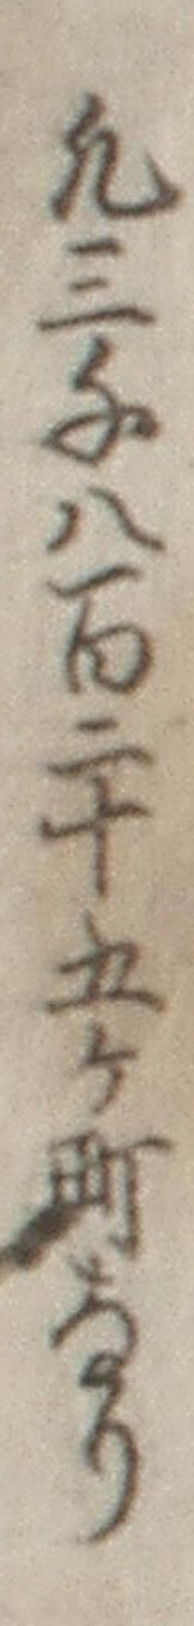凡三千八百二十五ヶ町なり

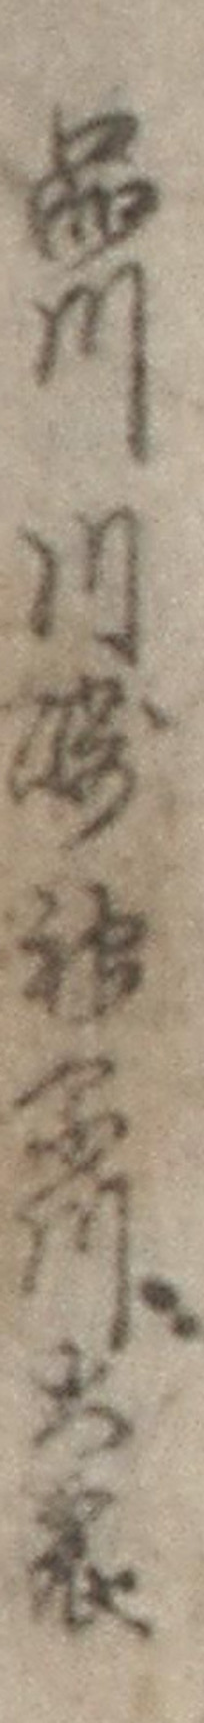品川川崎神奈川大震
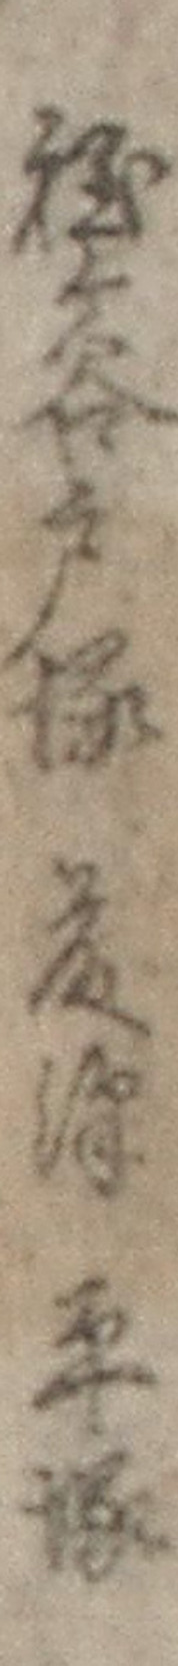程ヶ谷戸塚藤沢平塚
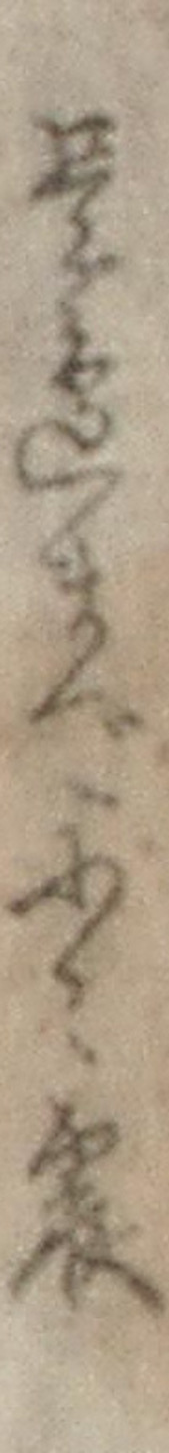是辺まで少〻震
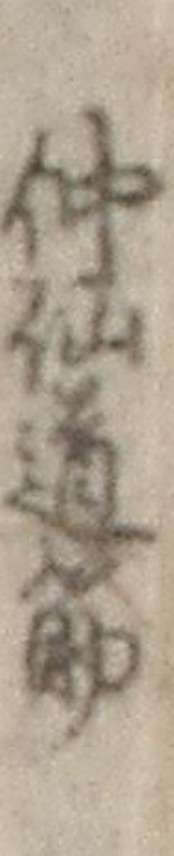仲仙道筋
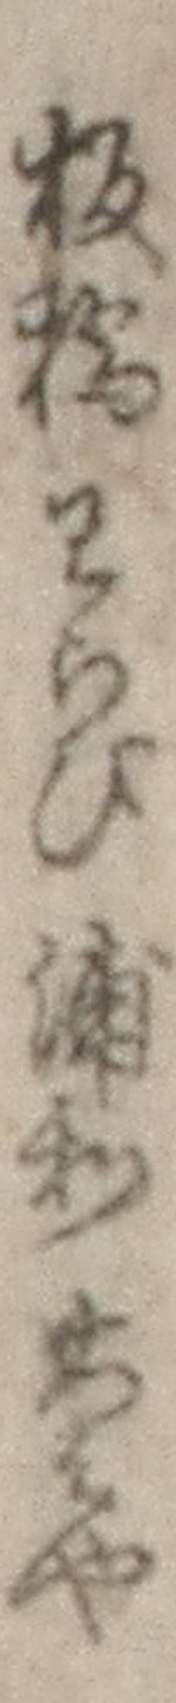板橋わらび浦和大みや
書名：江戸　大地震臣細録　全
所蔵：東京大学地震研究所図書室 Earthquake Research Institute Library, The University of Tokyo, JAPAN
